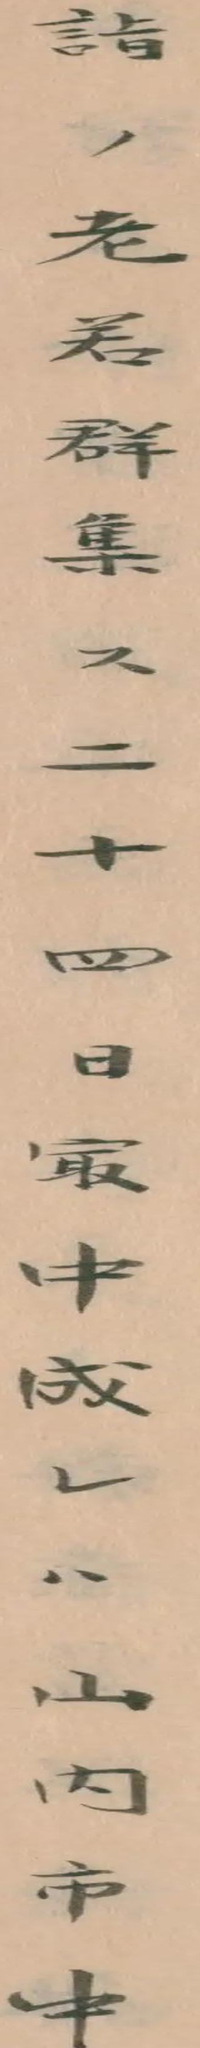詣ノ老若群集ス二十四日最中成レハ山内市中
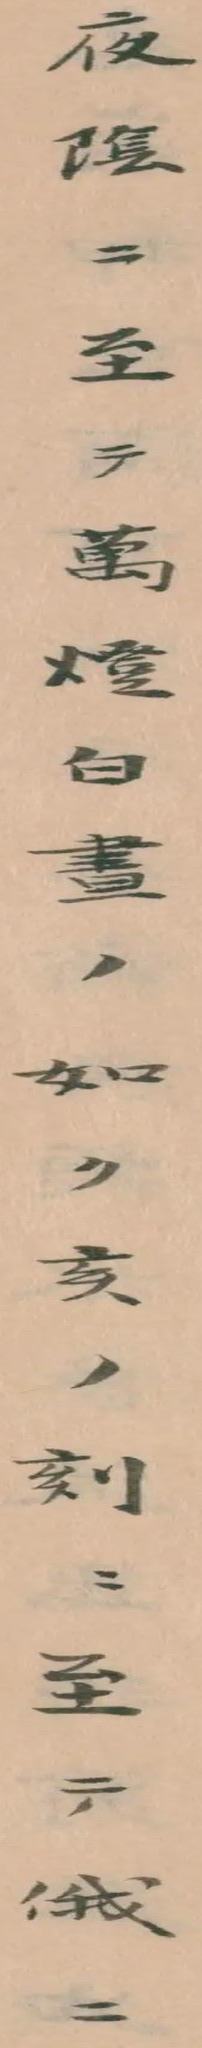夜陰ニ至テ萬灯白昼ノ如ク亥ノ刻ニ至テ俄ニ
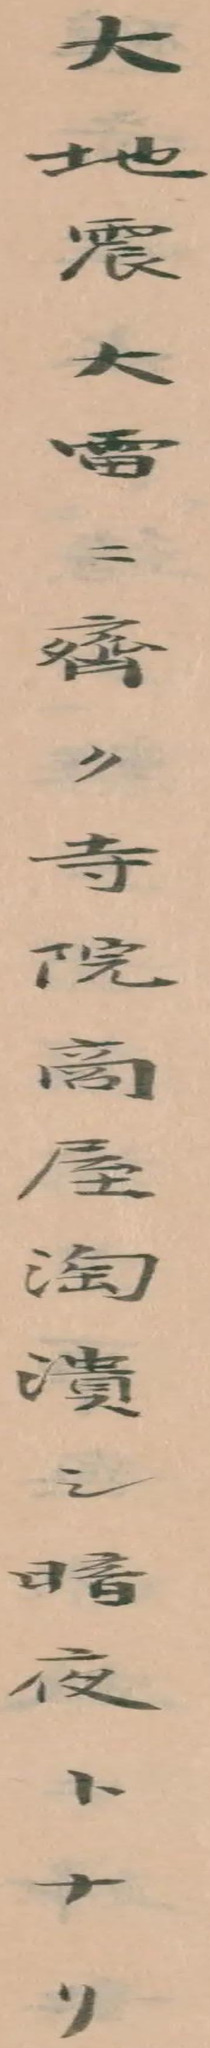大地震大雷ニ齊ク寺院商屋淘潰シ暗夜トナリ
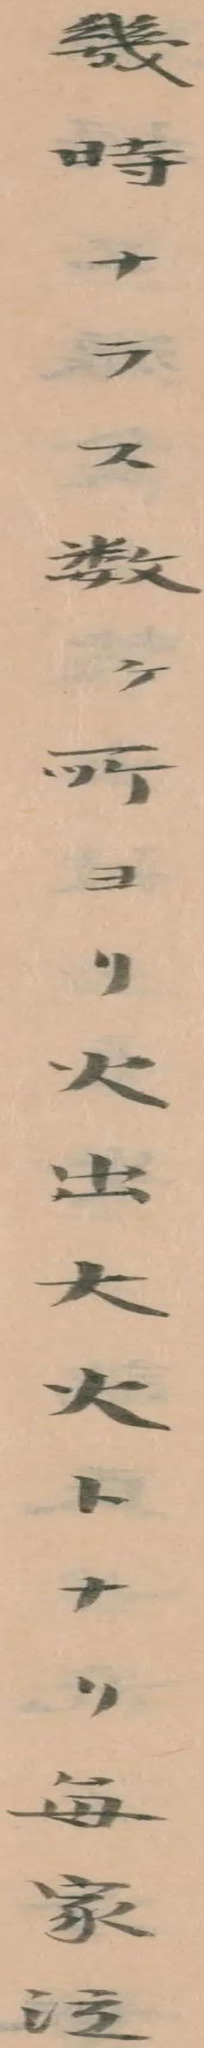幾時ナラス数ヶ所ヨリ火出大火トナリ毎家泣
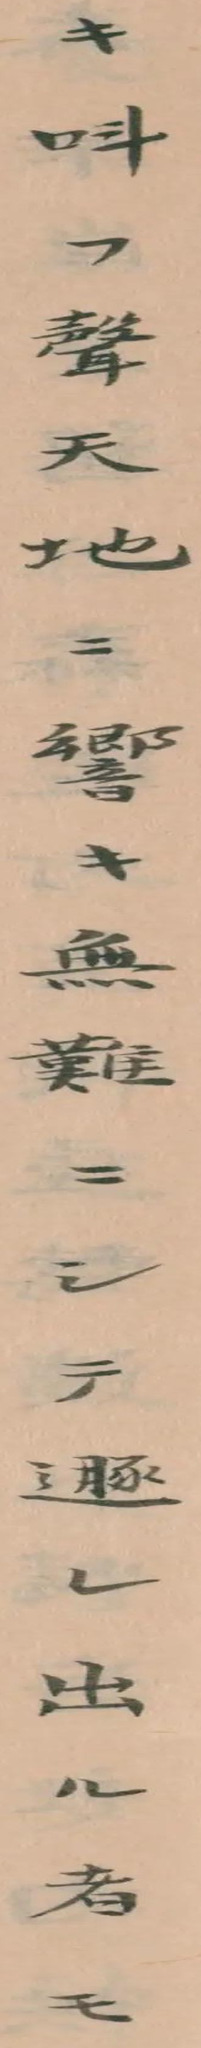キ叫フ声天地ニ響キ無難ニシテ遯レ出ル者モ
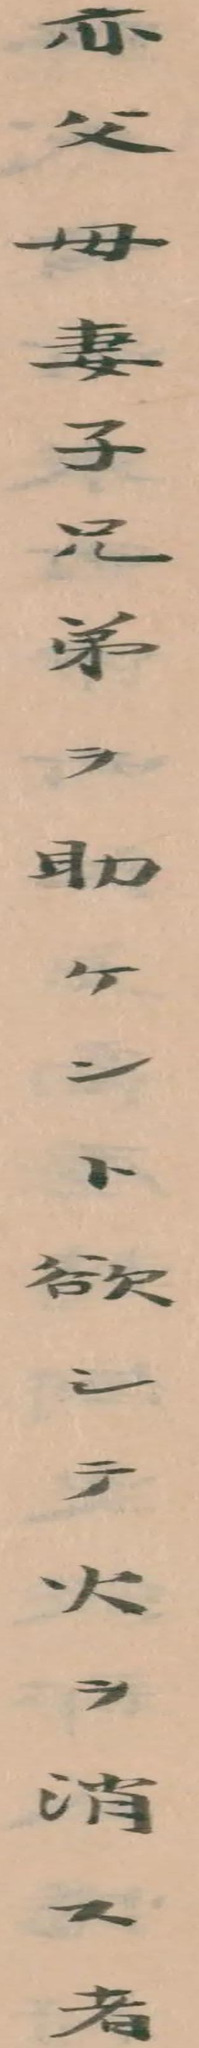亦父母妻子兄弟ヲ助ケント欲シテ火ヲ消ス者
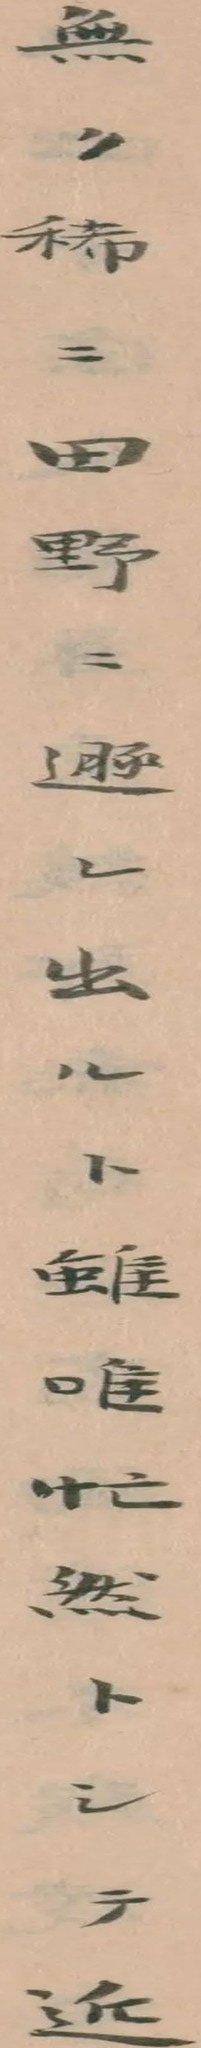無ク稀ニ田野ニ遯レ出ルト雖唯忙然トシテ近
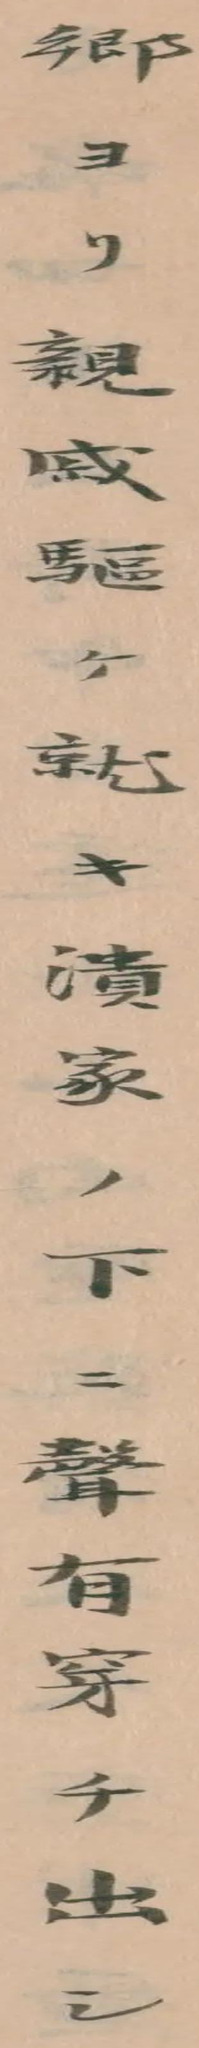郷ヨリ親戚駆ケ就キ潰家ノ下ニ声有穿チ出シ
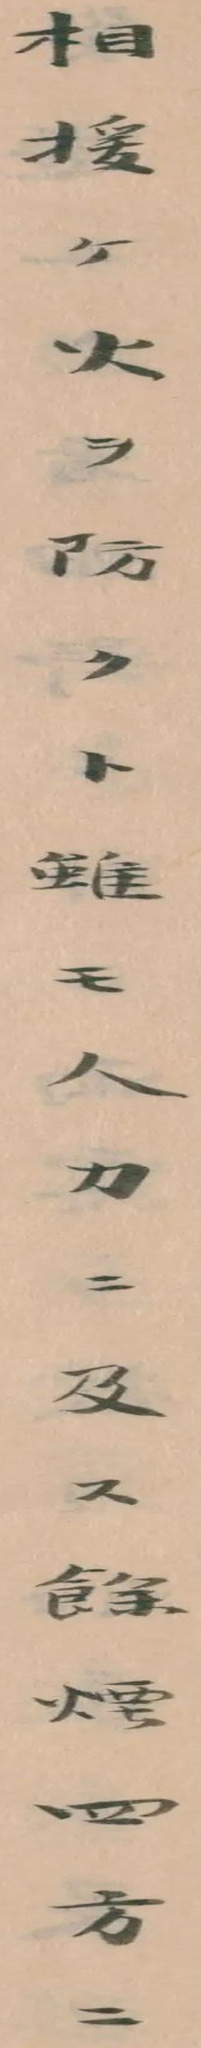相援ケ火ヲ防クト雖モ人力ニ及ス余煙四方ニ
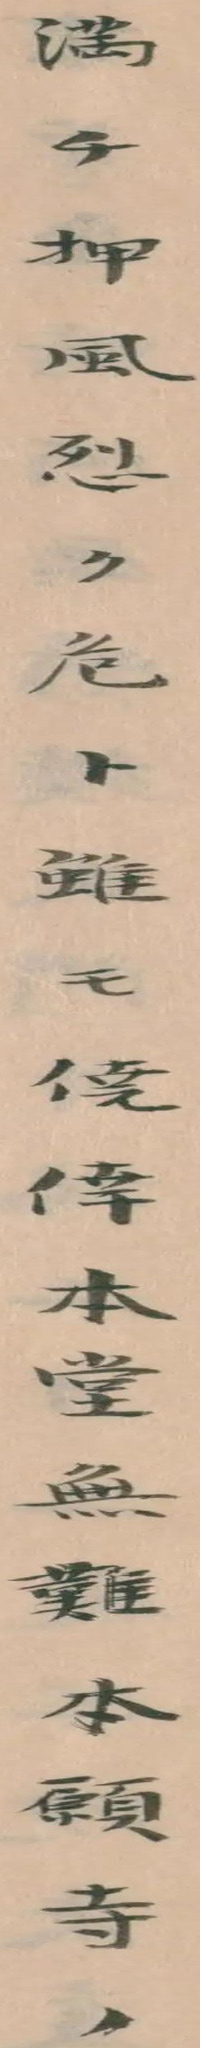満チ押風烈ク危ト雖モ僥倖本堂無難本願寺ノ
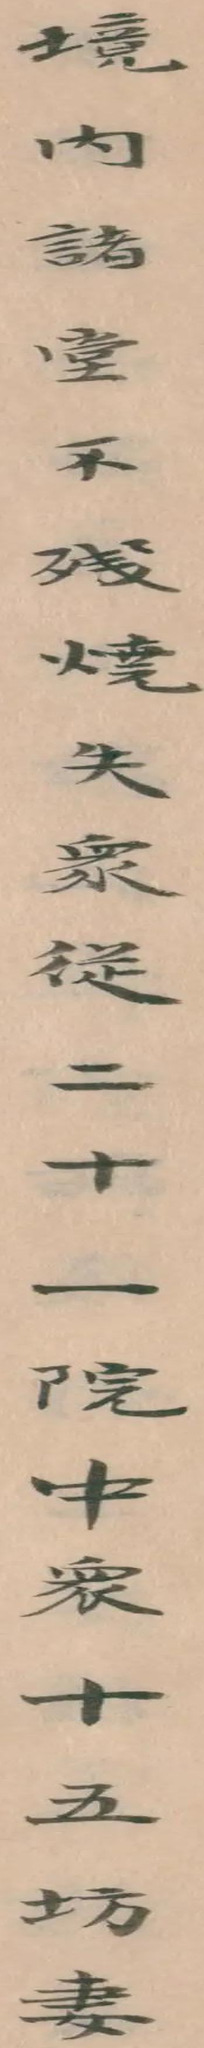境内諸堂不残焼失衆従二十一院中衆十五坊妻
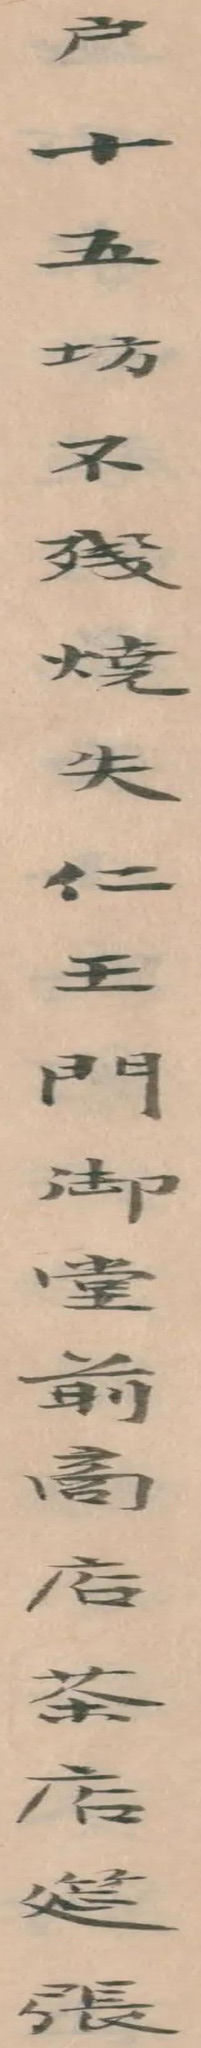戸十五坊不残焼失仁王門御堂前商店茶店筵張
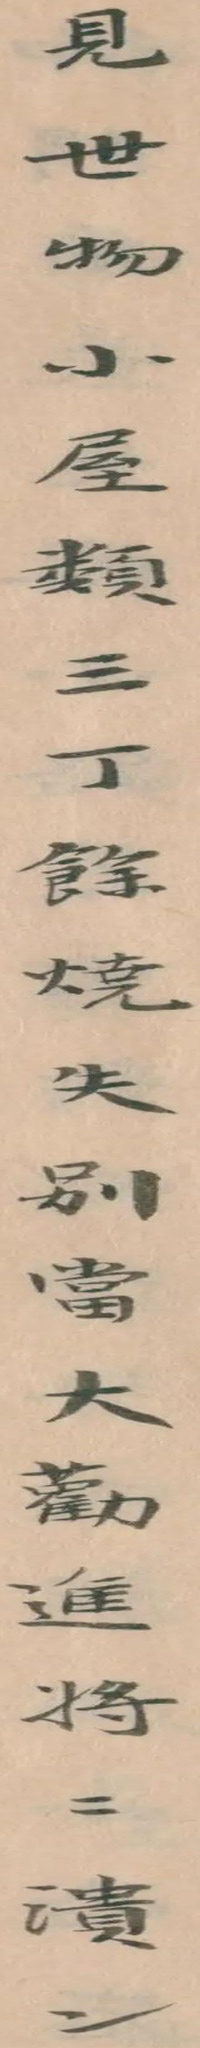見世物小屋類三丁余焼失別当大勧進将ニ潰ン
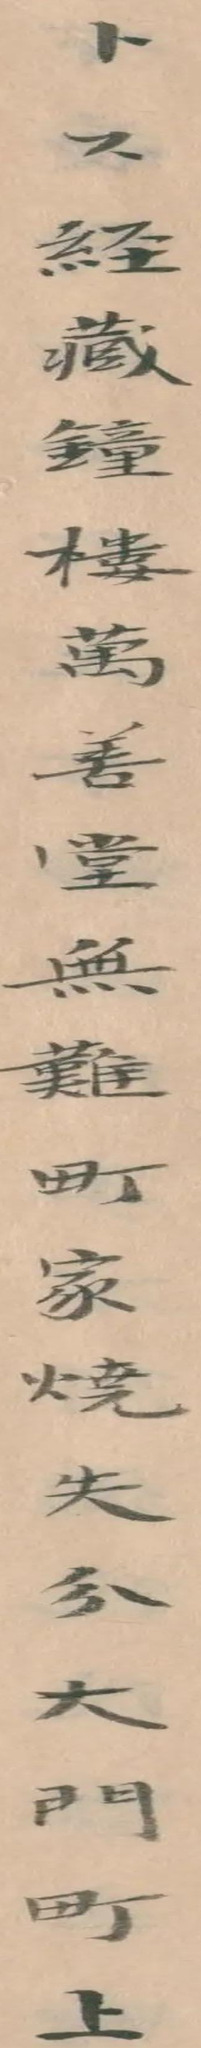トス経藏鐘楼萬善堂無難町家焼失分大門町上

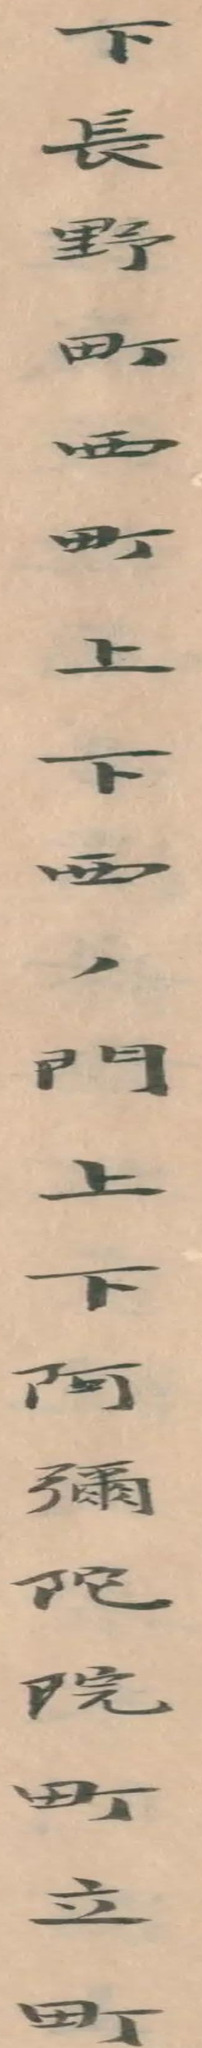下長野町西町上下西ノ門上下阿弥陀院町立町
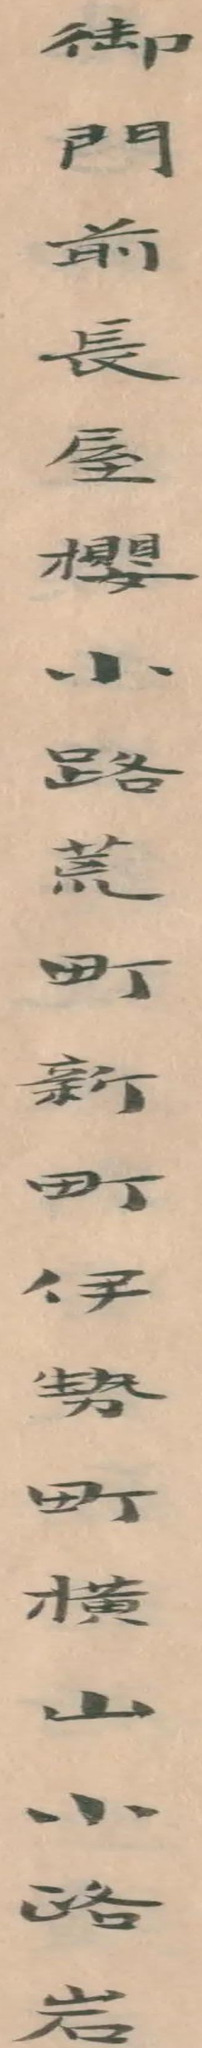御門前長屋桜小路荒町新町伊勢町横山小路岩
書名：地災撮要. 巻5-6(地震之部)
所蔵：国立国会図書館 National Diet Library, JAPAN
